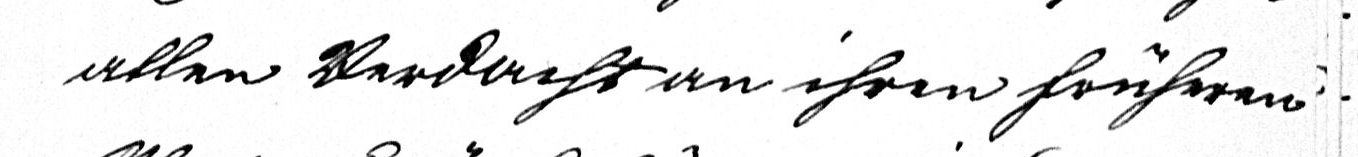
allen Verdacht an ihren früheren
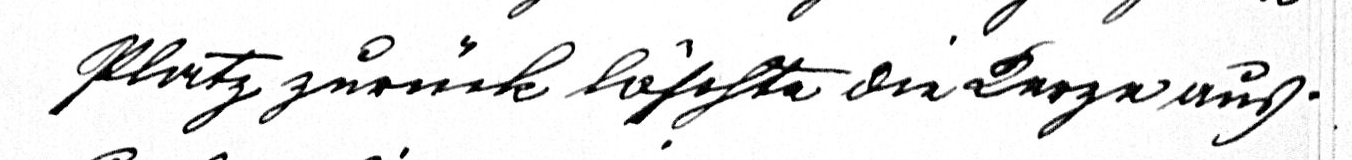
Platz zurück löschte die Kerze aus
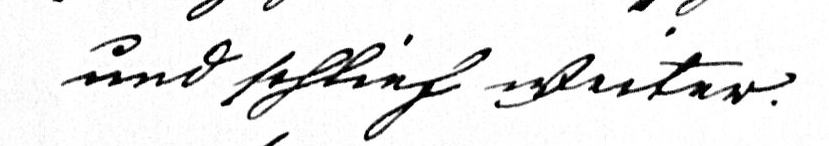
und schlief weiter.
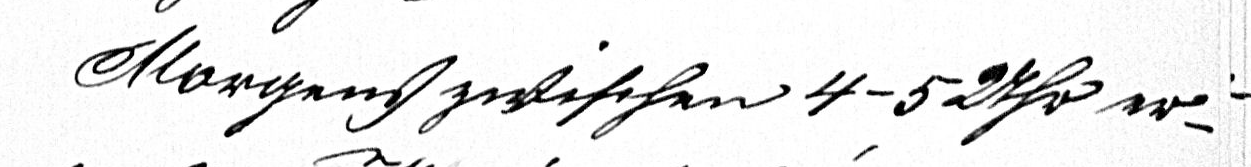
Morgens zwischen 4 - 5 Uhr er¬
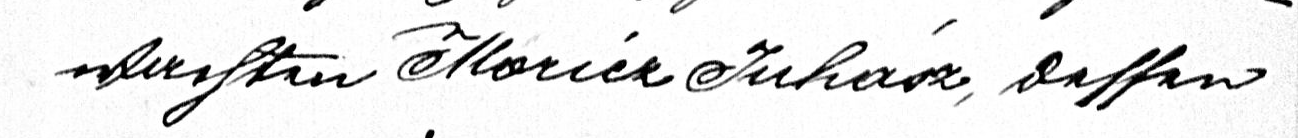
wachten Moricz Juhász, dessen
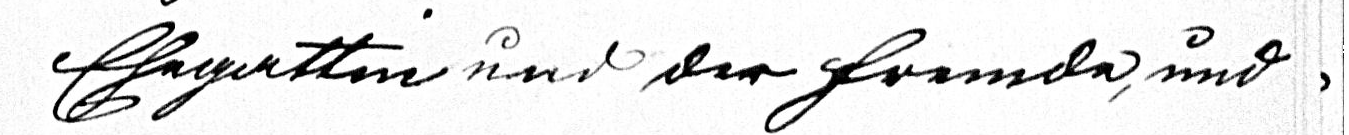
Ehegattin und der Fremde, und
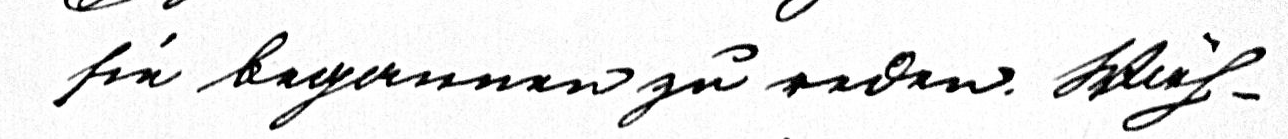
sie begannen zu reden. Wäh¬
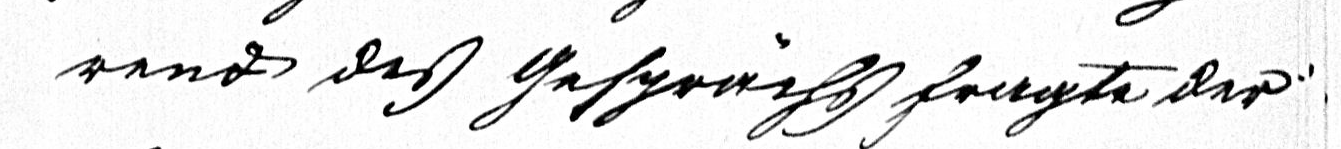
rend des Gesprächs fragte der
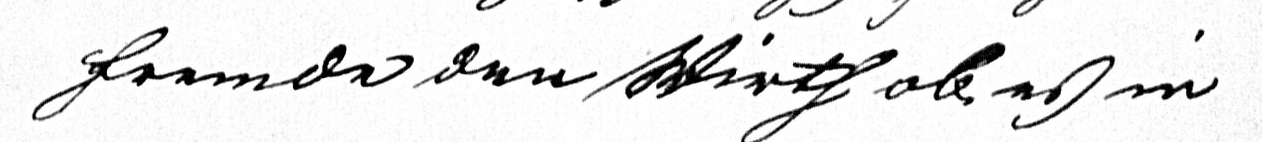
fremde den Wirth ob es in
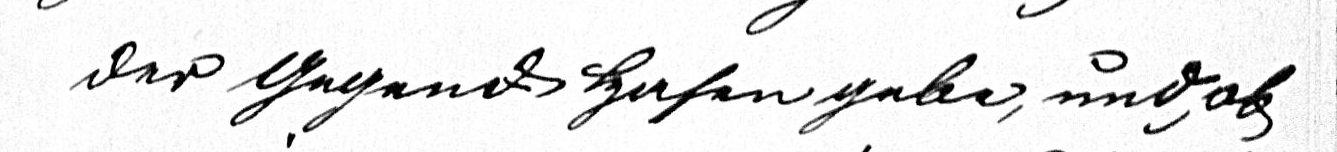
der Gegend Hafen gebe, und ob
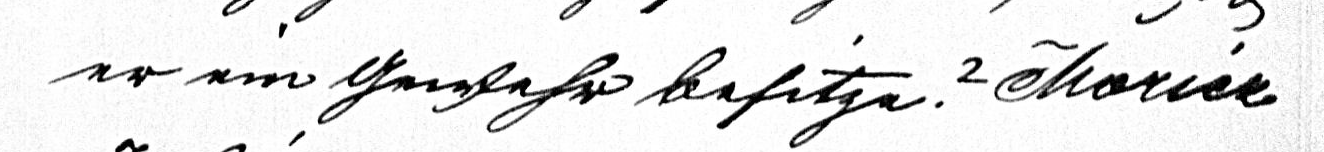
er ein Gewahr besitze. 2 Moricz
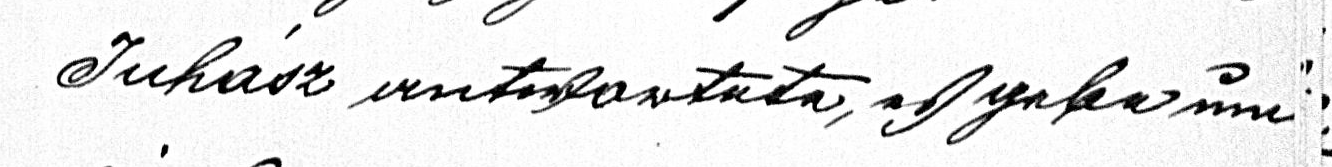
Juhász antwortete, es gebe um
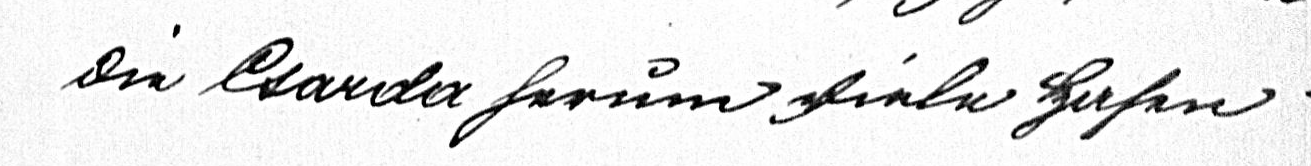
die Csarda herum viele Hasen
